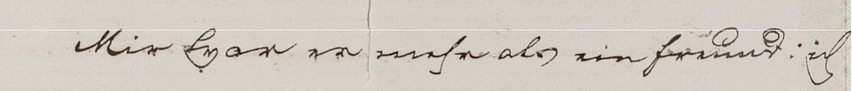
Mir war er mehr als ein Freund: ich
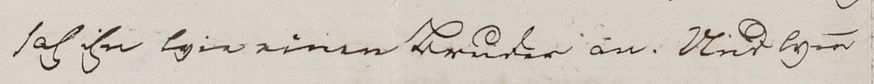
sah ihn wie einen Bruder an. Und wenn
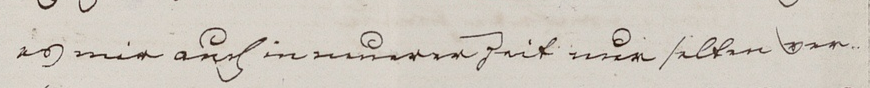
es mir auch in neuerer Zeit nur selten ver-
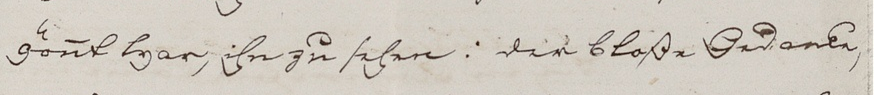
gönnt war, ihn zu sehen: der bloße Gedanke,
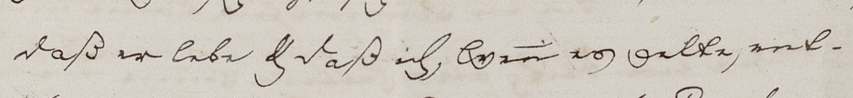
daß er lebe & daß ich, wenn es gelte, ent-
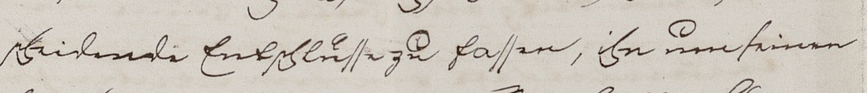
scheidende Entschlüsse zu fassen, ihn um seinen
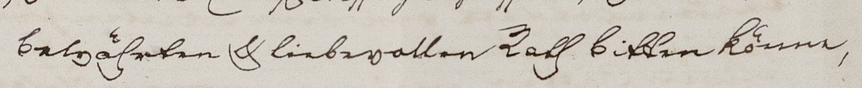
bewährten & liebevollen Rath bitten könne,
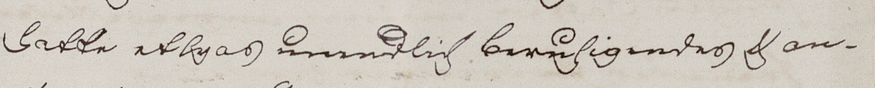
hatte etwas unendlich beruhigendes & an-
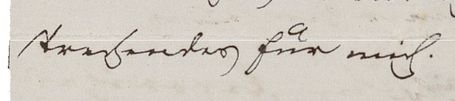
sprechendes für mich.
